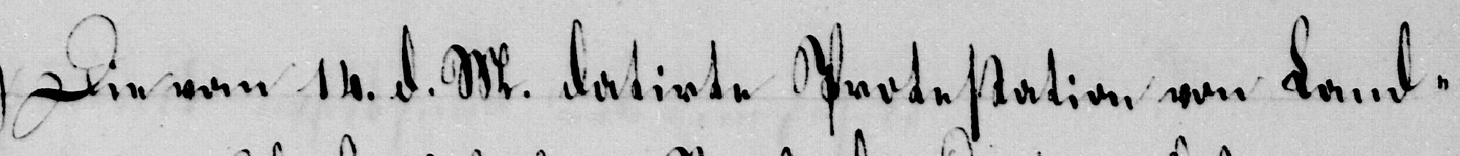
Die vom 14. d. M. datirte Protestation von Land¬
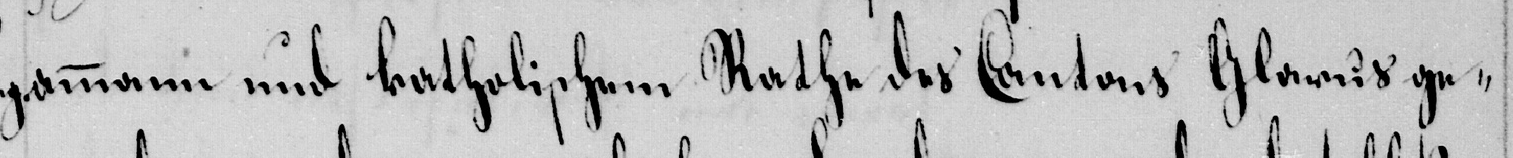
ammann und katholischem Rathe des Cantons Glarus ge¬
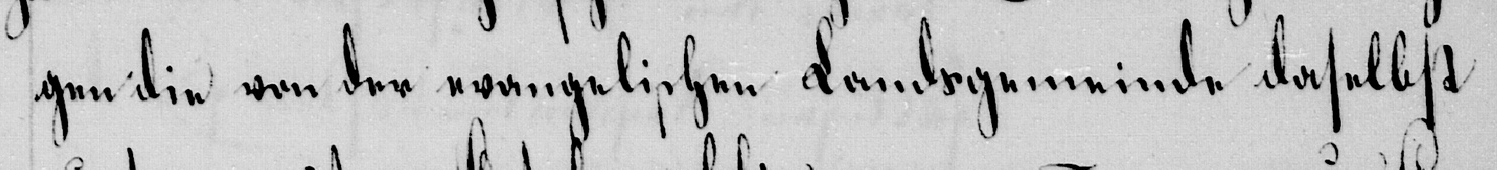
gen die von der evangelischen Landsgemeinde daselbst
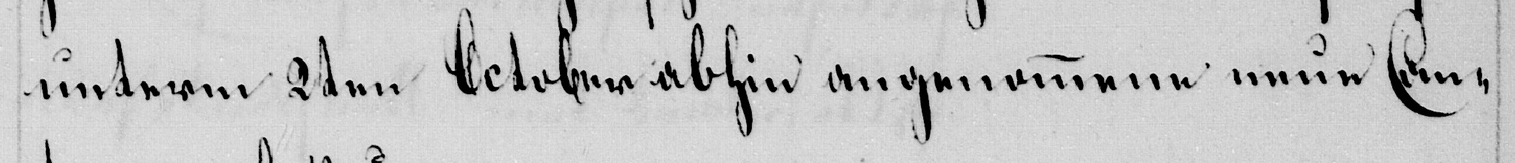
unterm 3ten October abhin angenommene neue Can¬
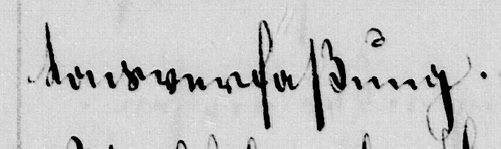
tonsverfaßung.
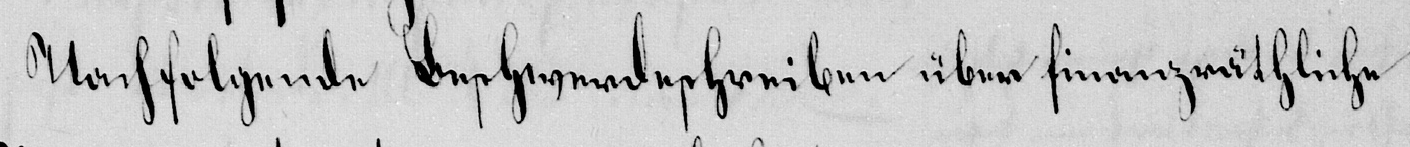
Nachfolgende Beschwerdeschreiben über finanzräthliche
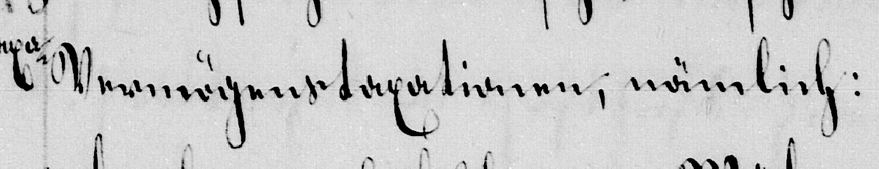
Vermögenstaxationen, nämlich:
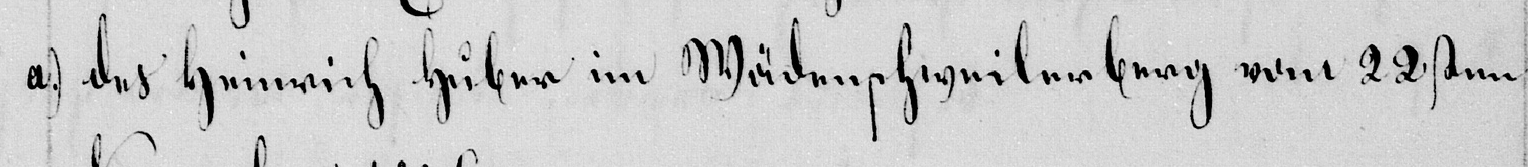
a.) des Heinrich Huber im Wädenschweilerberg vom 22sten
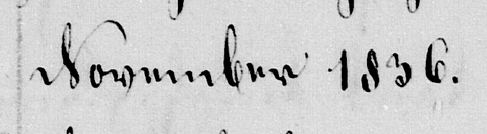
November 1836.
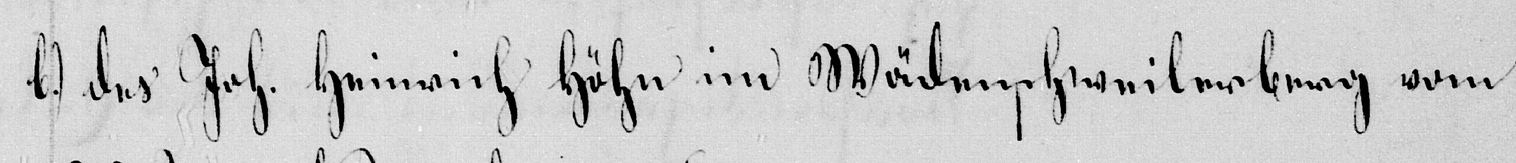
b.) des Joh. Heinrich Höhn im Wädenschweilerberg vom
